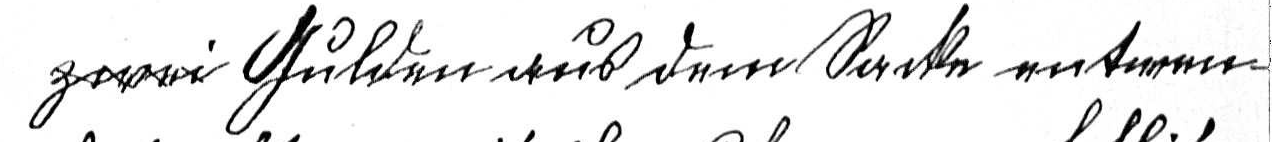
Gulden aus dem Sacke entwen¬
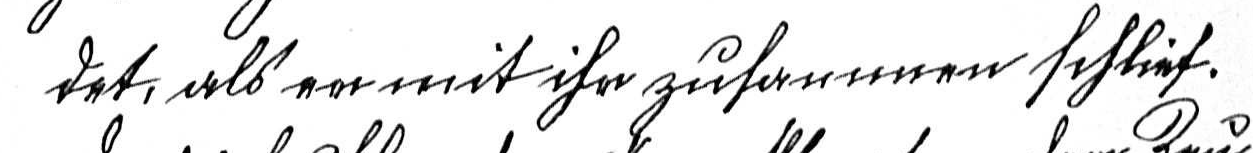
det, als er mit ihr zusammen schlief.
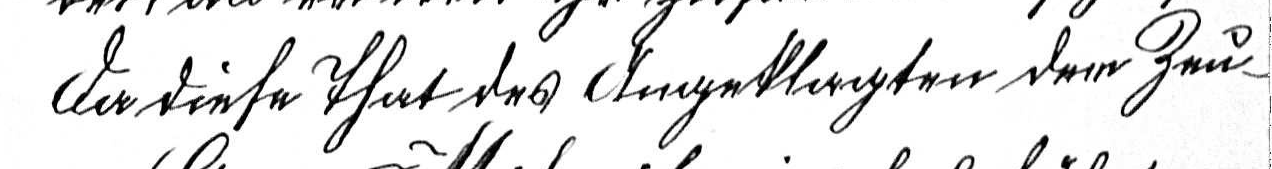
Da diese That des Angeklagten der Zeu¬
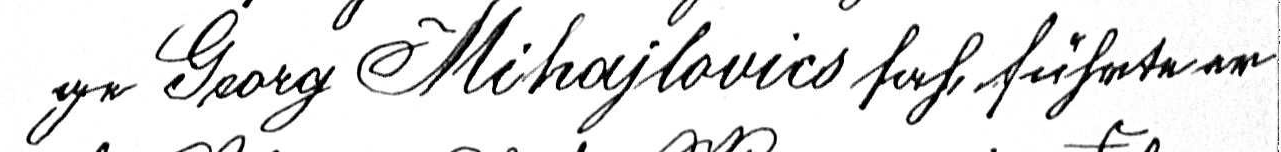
ge Georg Mihajlovics sah, führte er
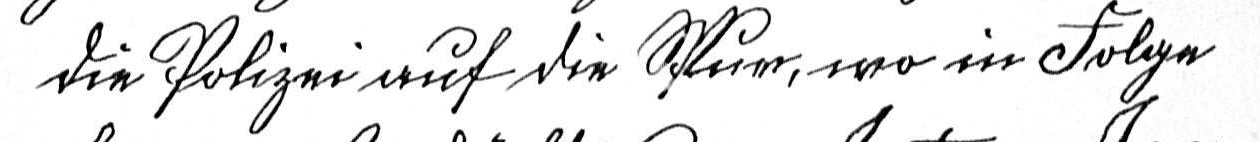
die Polizei auf die Spur, wo in Folge
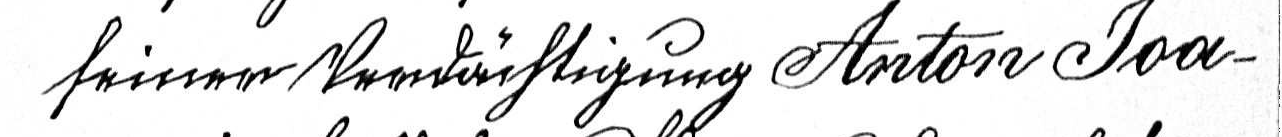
seiner Verdächtigung Anton Ioa¬
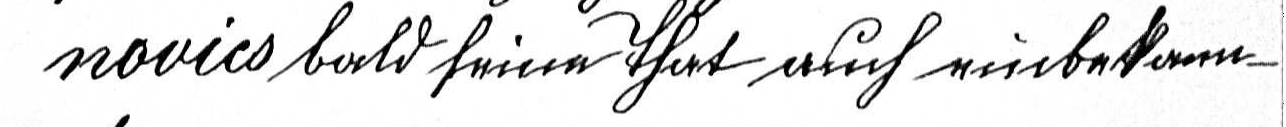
novics bald seine That auch einbekann¬
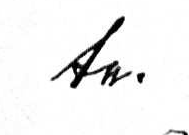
te.
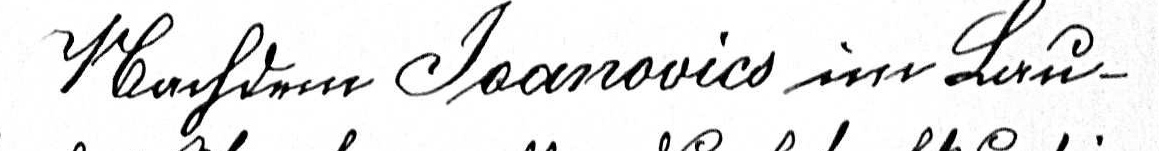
Nachdem Ioanovics im Lau¬
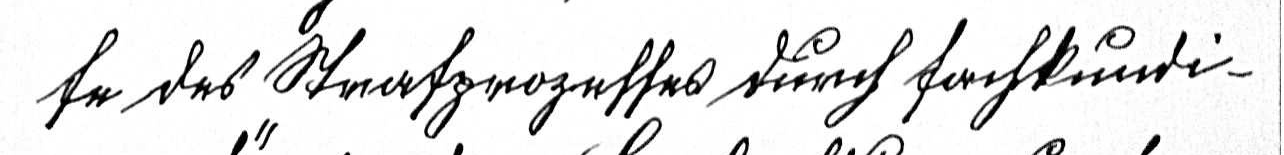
fe des Strafprozesses durch fachkundi¬
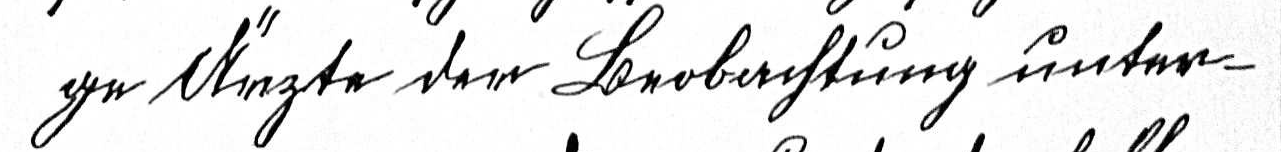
ge Ärzte der Beobachtung unter¬
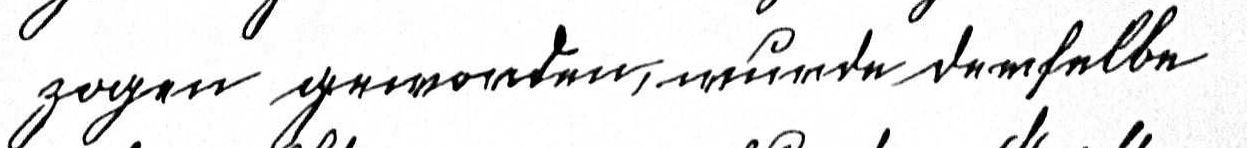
zogen geworden, wurde derselbe
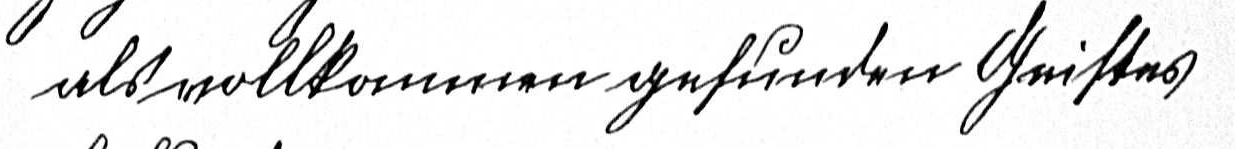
als vollkommen gesunden Geistes
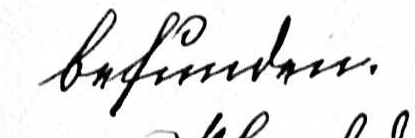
befunden.
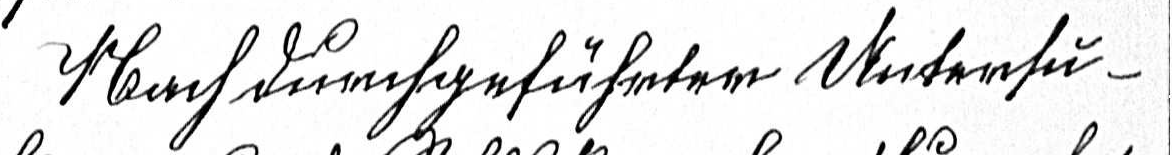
Nach durchgeführter Untersu¬
